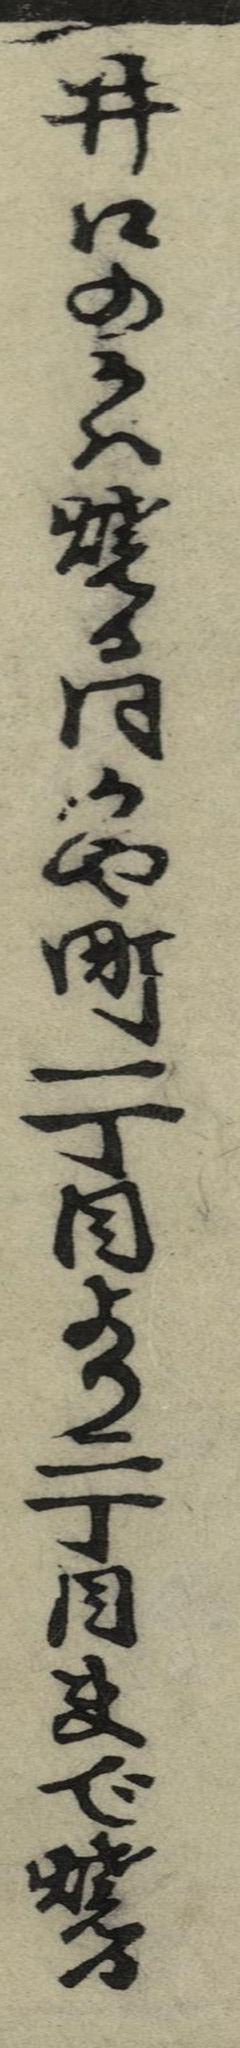井口のかは焼る同かや町一丁目より二丁目まで焼る
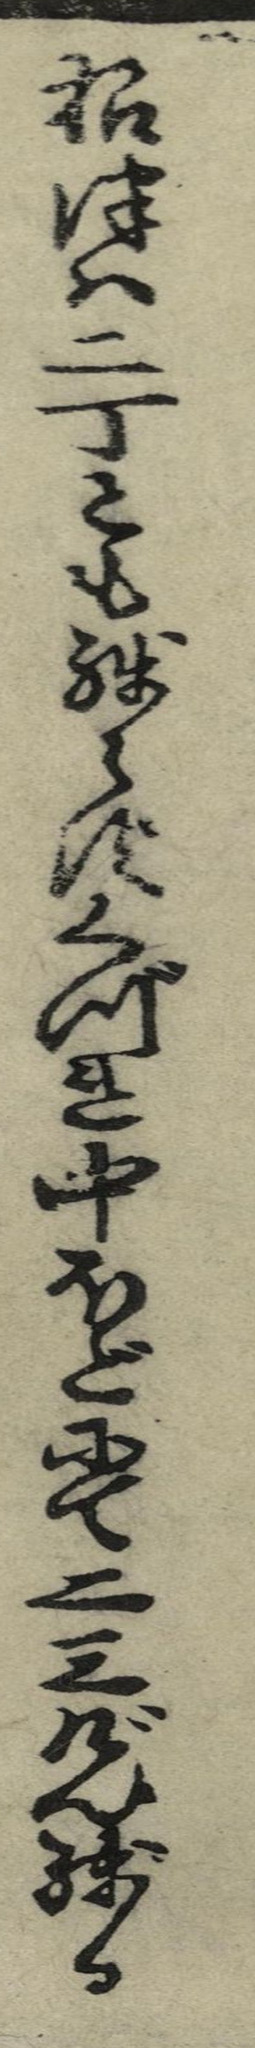根津は二丁とも残らずくづれ中ほどにてニ三げん残る
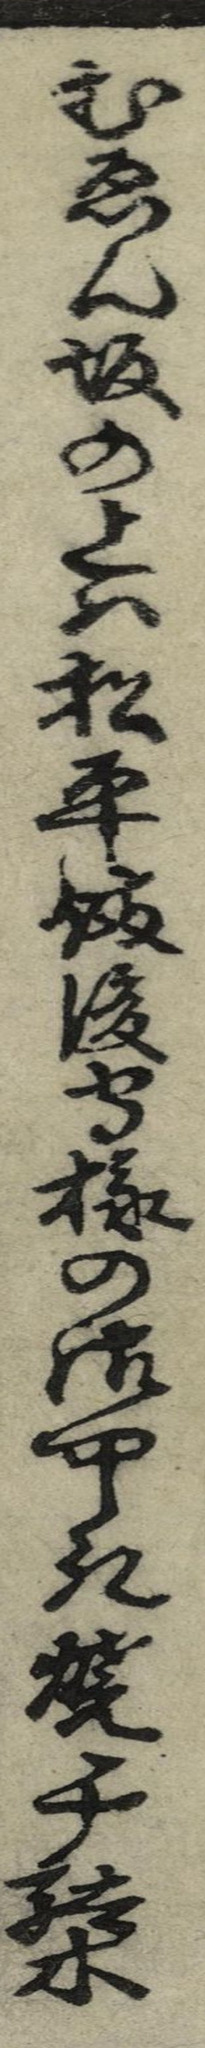むゑん坂の上は松平越後守様の御やしき焼千駄木
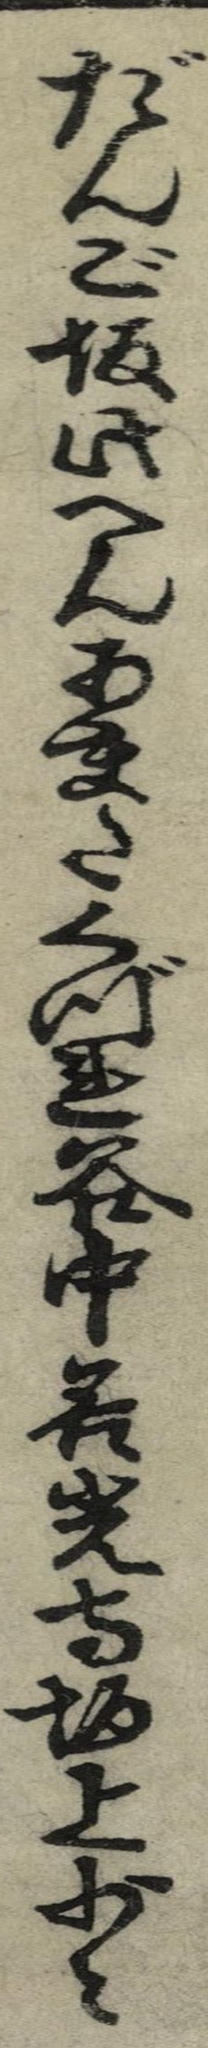だんご坂此へんあまたくづれ谷中善光寺坂上少〻
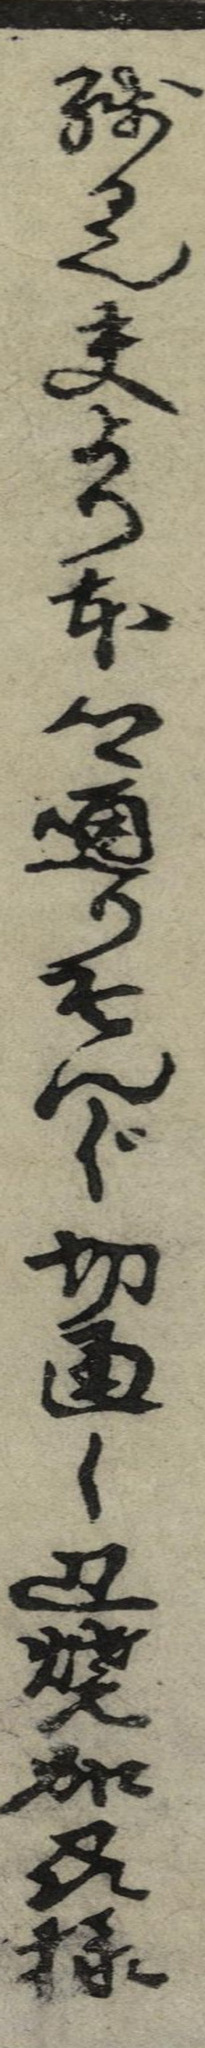残る也夫より本郷通りそんじ切通り辺焼加州様
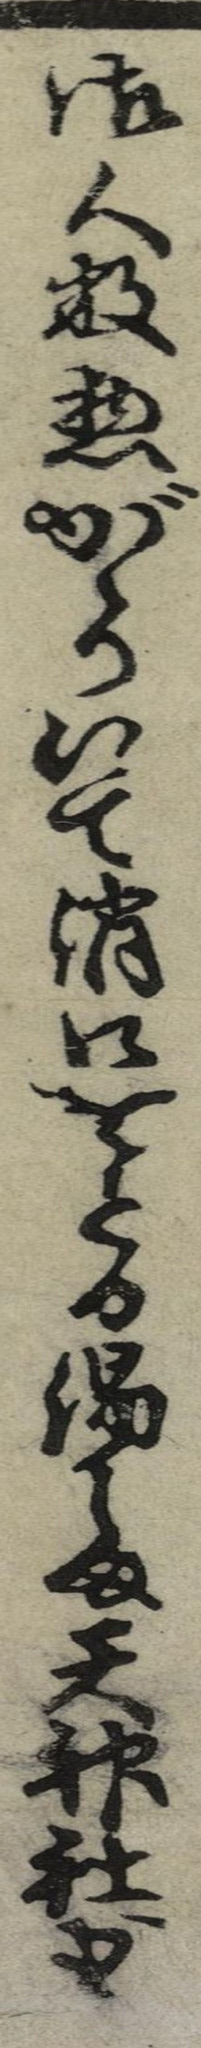御人数惣がゝりにて消口をとる湯しま天神社少〻
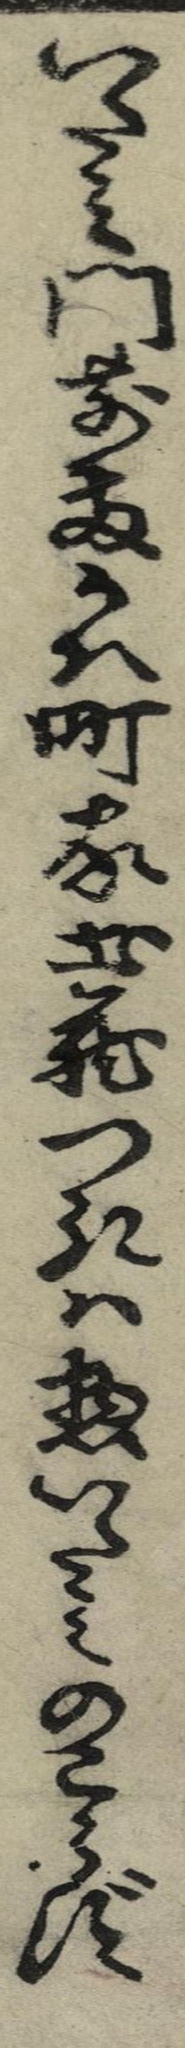いたみ門前両かは町家土蔵つきは惣いたみのこらず
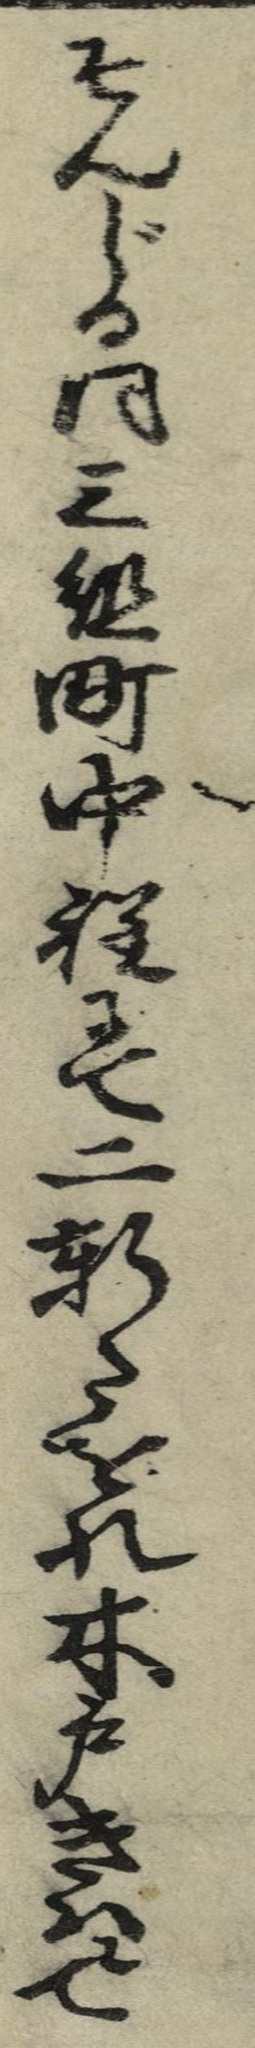そんじる同三組町中程にて二軒たをれ木戸きはにて日本橋
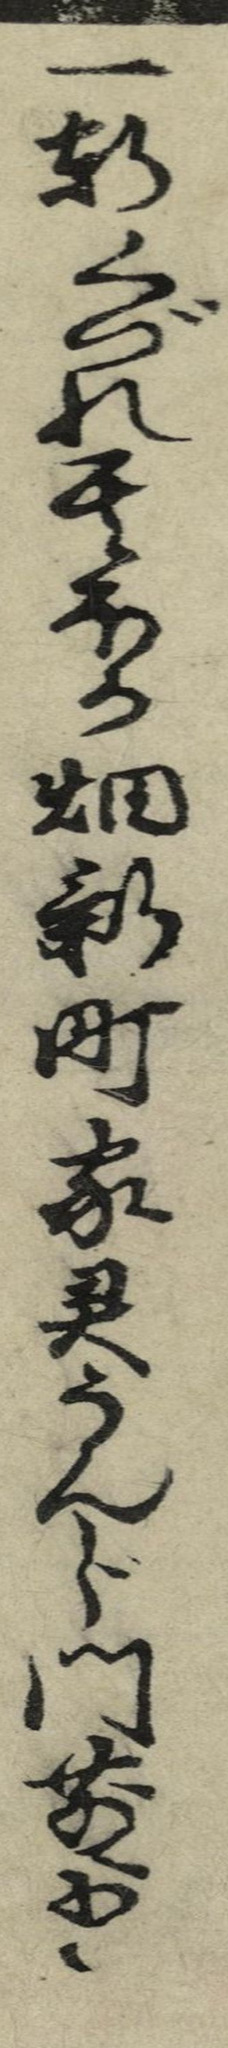一軒くづれ其ほか畑新町家霊うんじ門前少ゝ
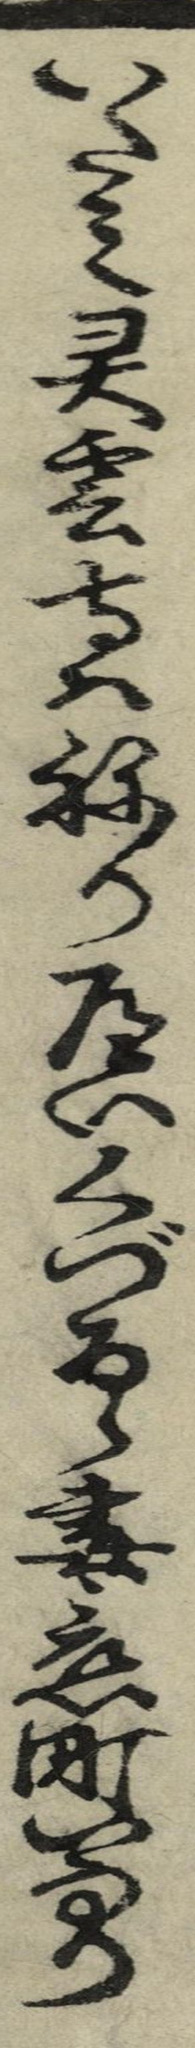いたみ霊雲寺はねり屋はくづるゝ妻恋町いなり
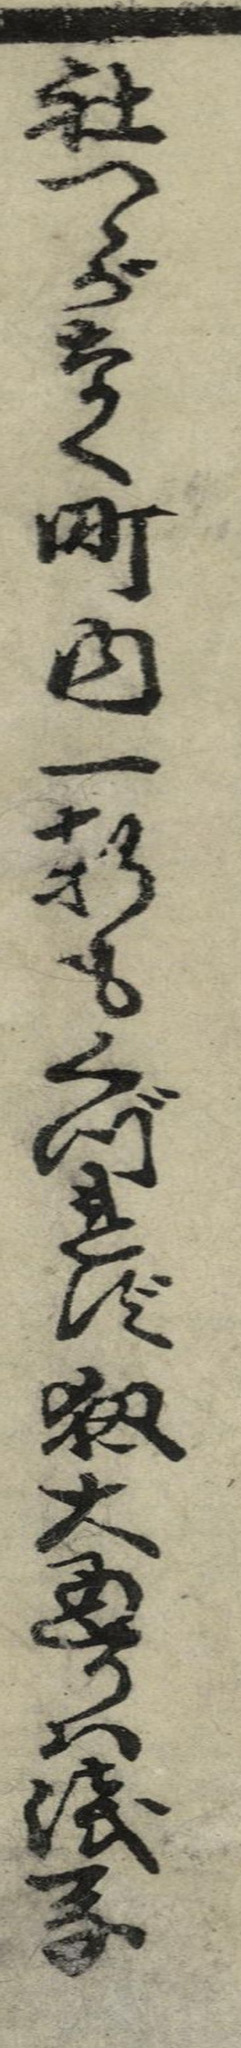社つゝがなく町内一軒もくづれず扨大通りは浅草
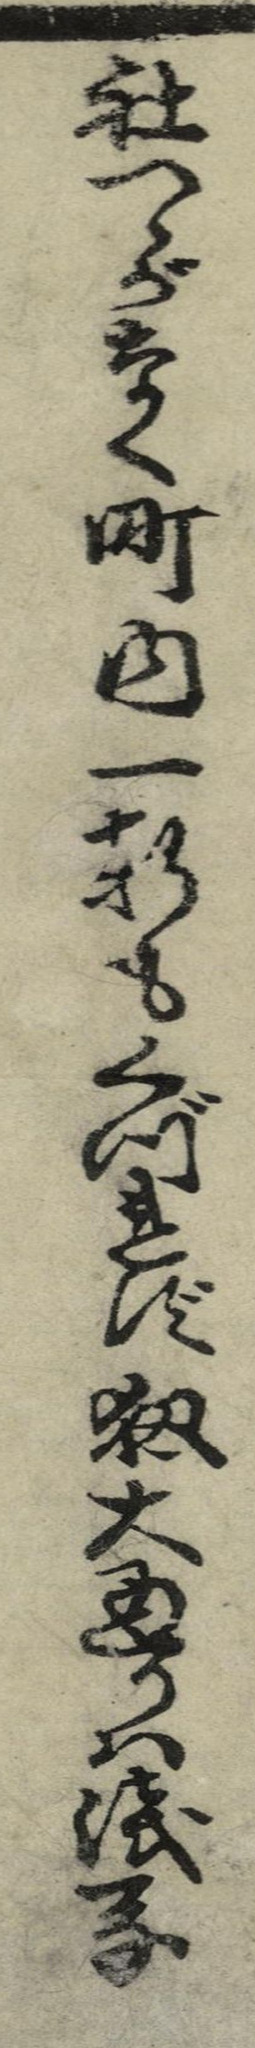社つゝがなく町内一軒もくづれず扨大通りは浅草
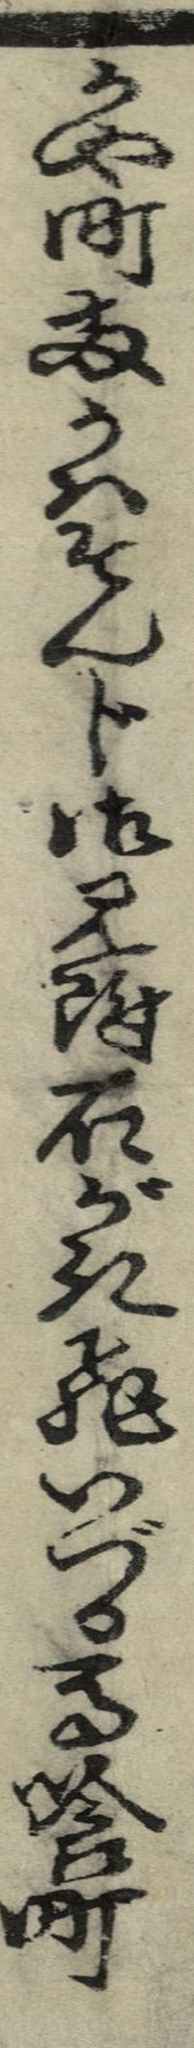かや町両かはそんじ御見付石がき蔵いづる馬喰町
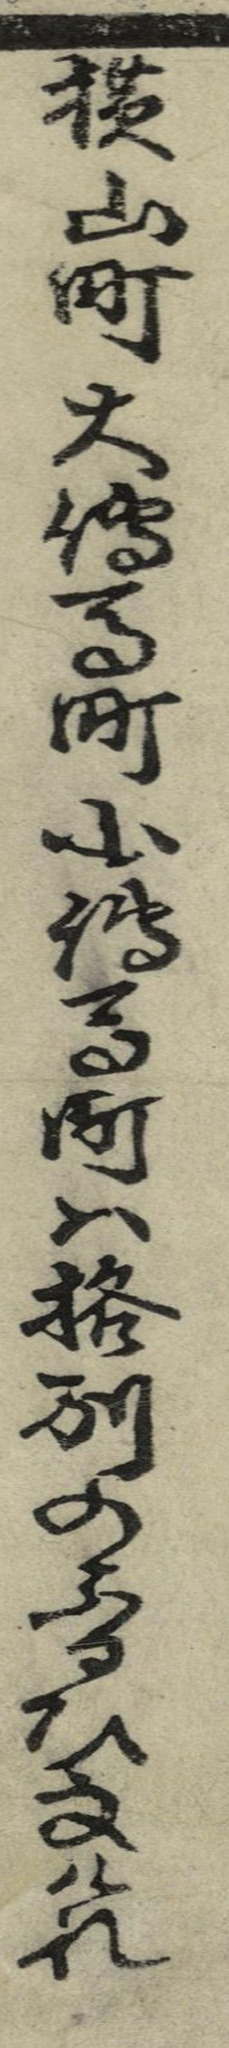横山町大伝馬町小伝馬町は格別のふるひなかれ
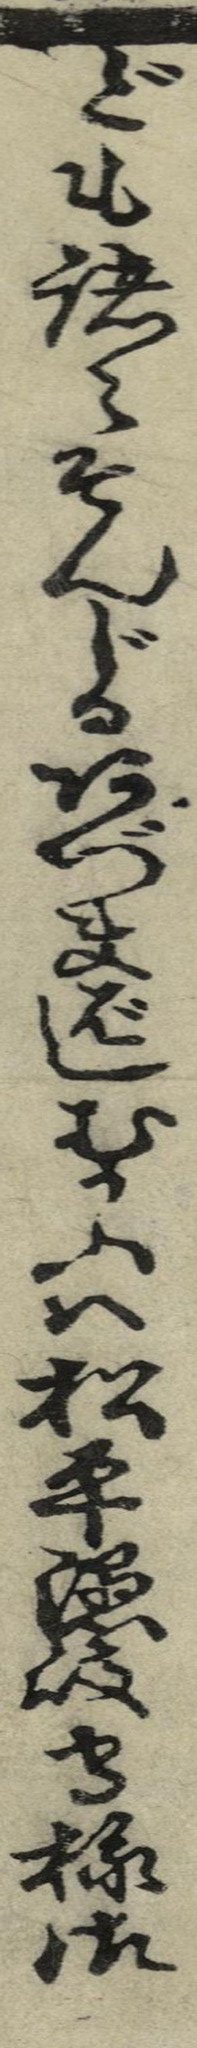ども諸〻そんじるあづまばしむかふは松平隠岐守様御丸之内
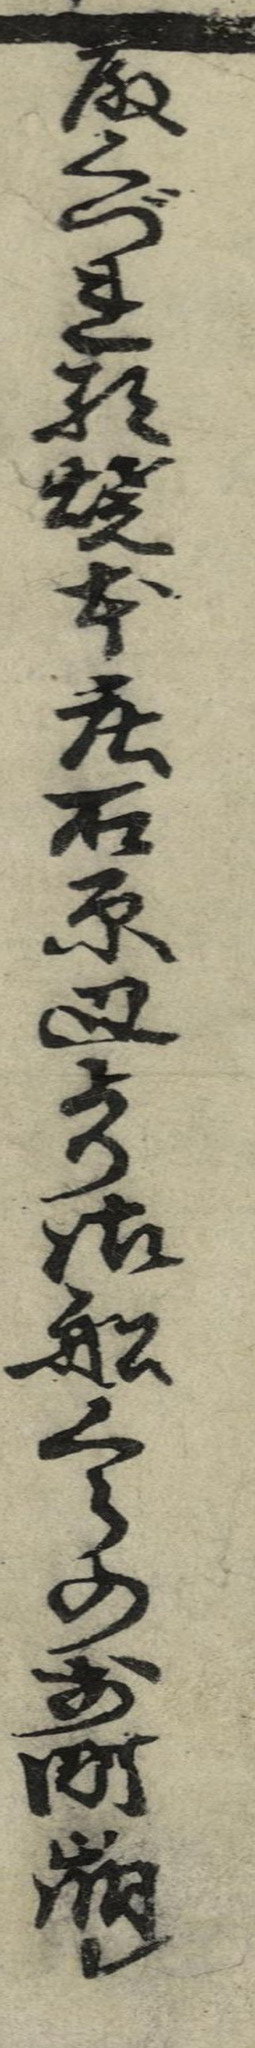殿くづれ類焼本庄石原辺より御舩くらの前町崩レ
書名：江戸大地震并出火場所極本しらべ
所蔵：東京大学地震研究所図書室 Earthquake Research Institute Library, The University of Tokyo, JAPAN
